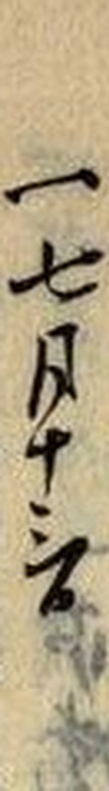一七月十三日
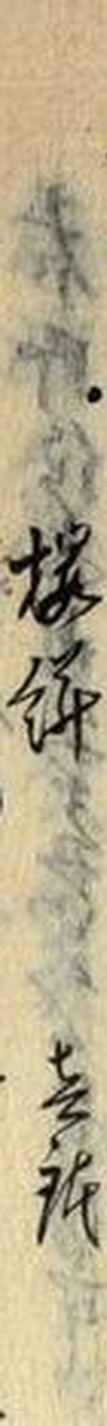桜餅壱鉢
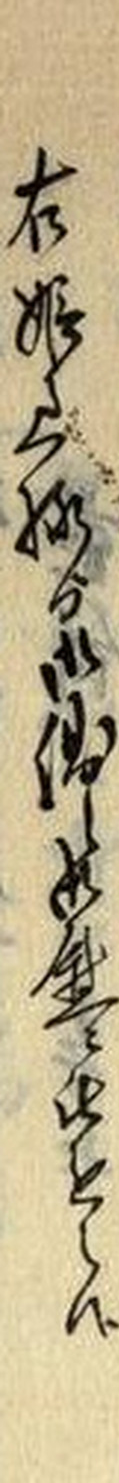右姫君様ゟ御側之御慰ニ被進之候
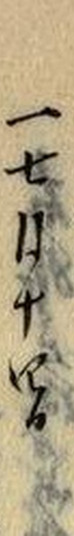一七月十四日
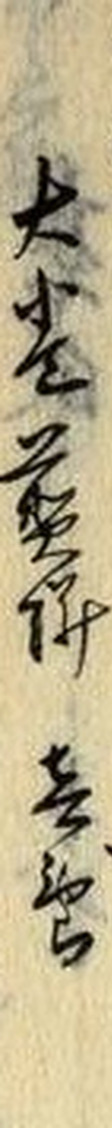大巻煎餅壱台
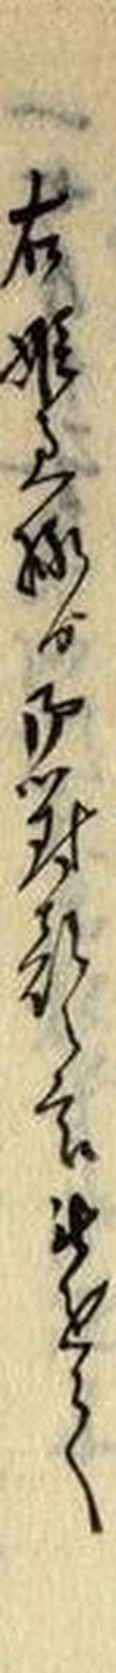右姫君様ゟ御対顔之節被進之
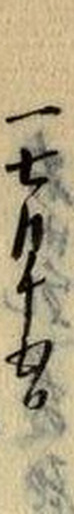一七月十五日
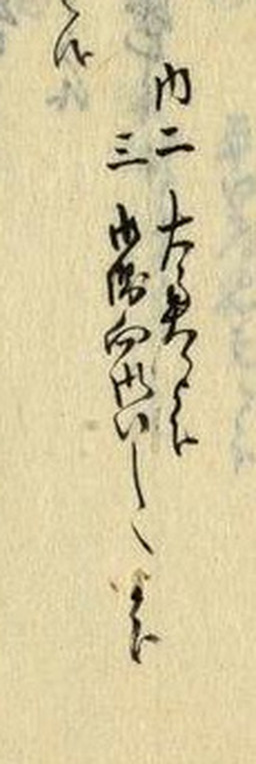三御側向御いしへ被下
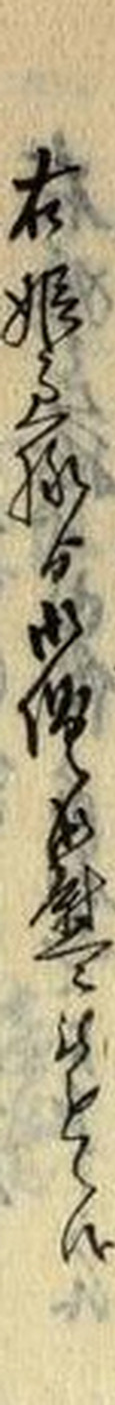右姫君様ゟ御側之御慰ニ被進之候
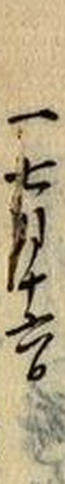一七月十六日
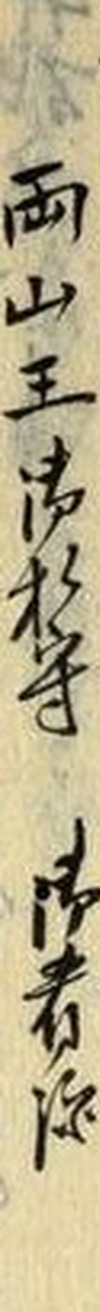両山王御札守御肴添
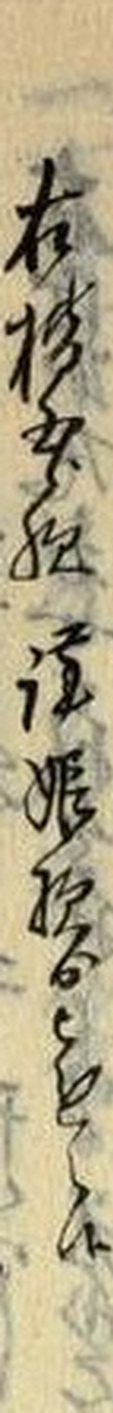右楷五郎様謹姫様ゟ被進之候
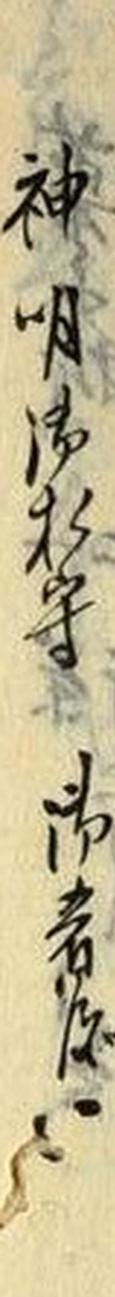神明御札守御肴添
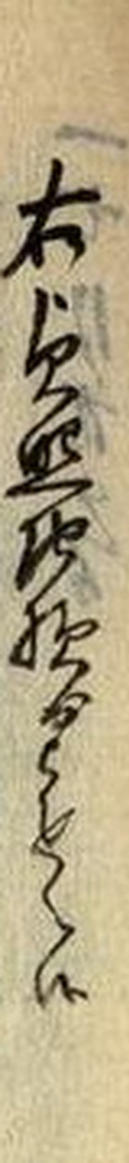右貞照院様ゟ被進之候
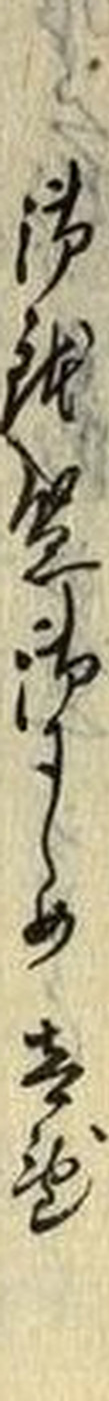御鉢盛御にしめ壱台
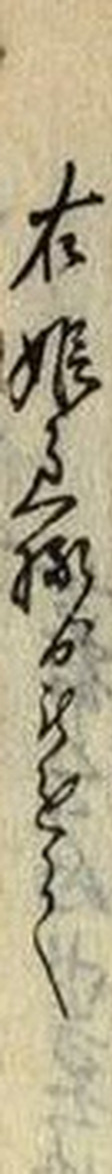右姫君様ゟ被進之
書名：少傅日録抄（斉承付側向頭取日記、在府）
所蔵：福井県文書館 Fukui Prefectural Archives
